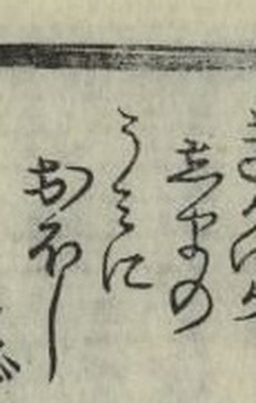うミに
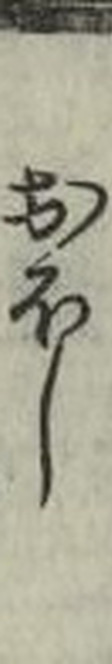おほし
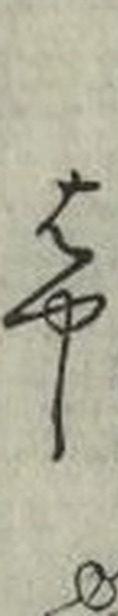はやし
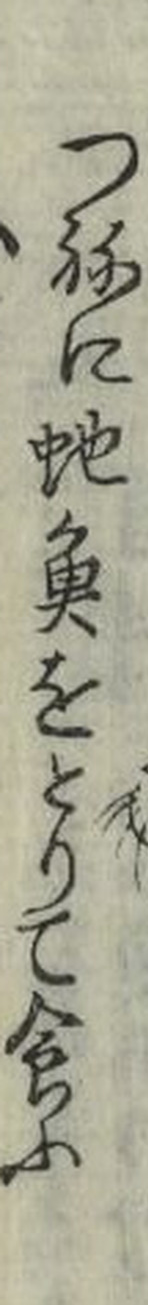つねに虵魚をとりて食ふ
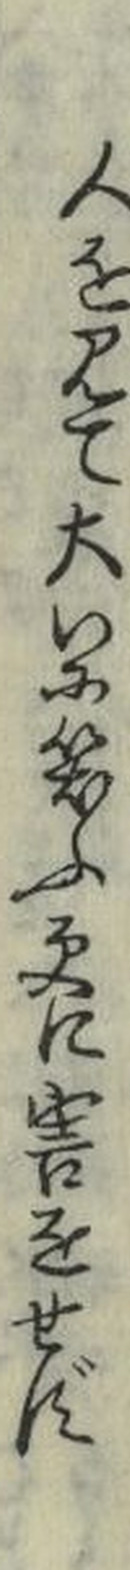人を見て大いに笑ふ更に害をせず

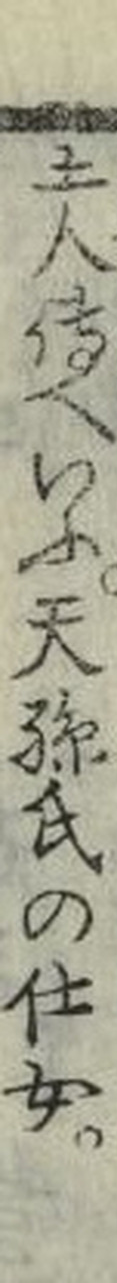土人傳へいふ。天孫氏の仕女。
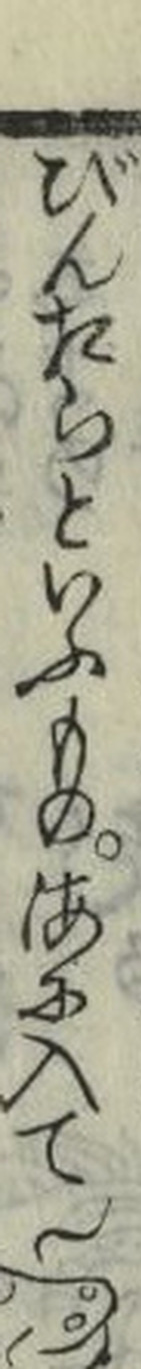びんたらといふもの。海に入て
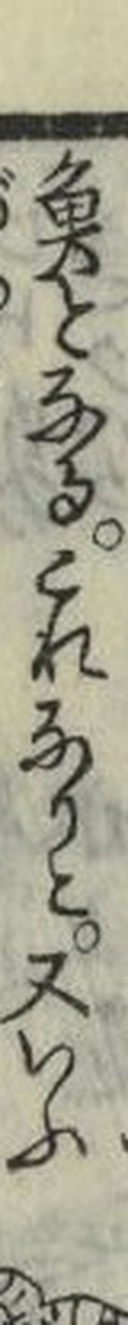魚となる。これなりと。又いふ
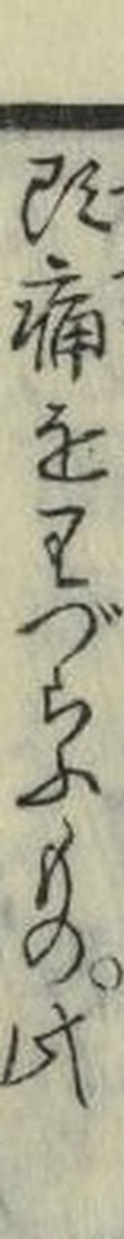頭痛をわづらふもの。此
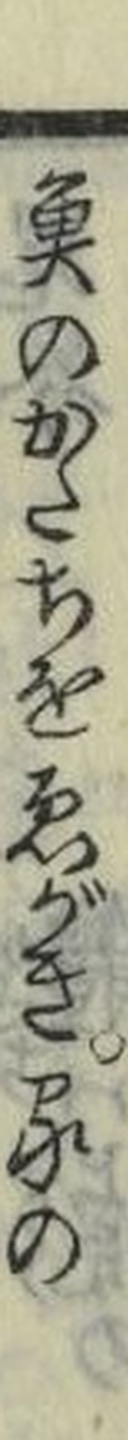魚のかたちをゑがき。家の
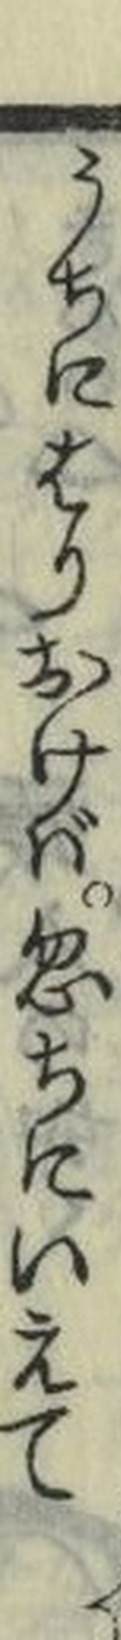うちにはりけりおけば。忽ちにいえて
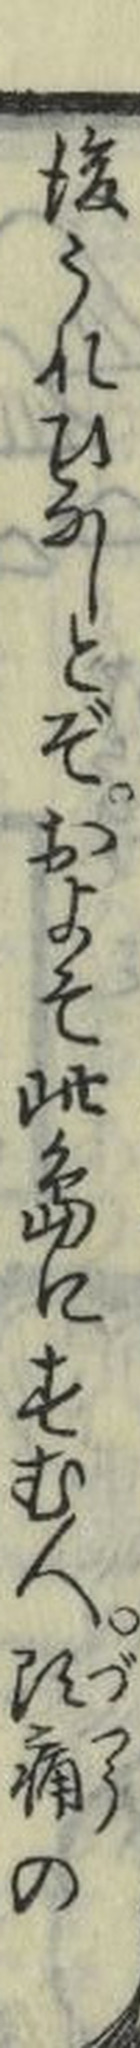後うれひなしとぞ。およそ此島にすむ人。頭痛
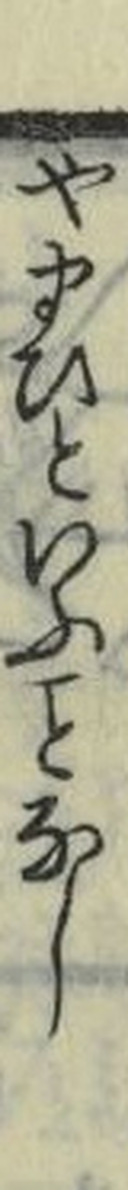やまひといふことなし
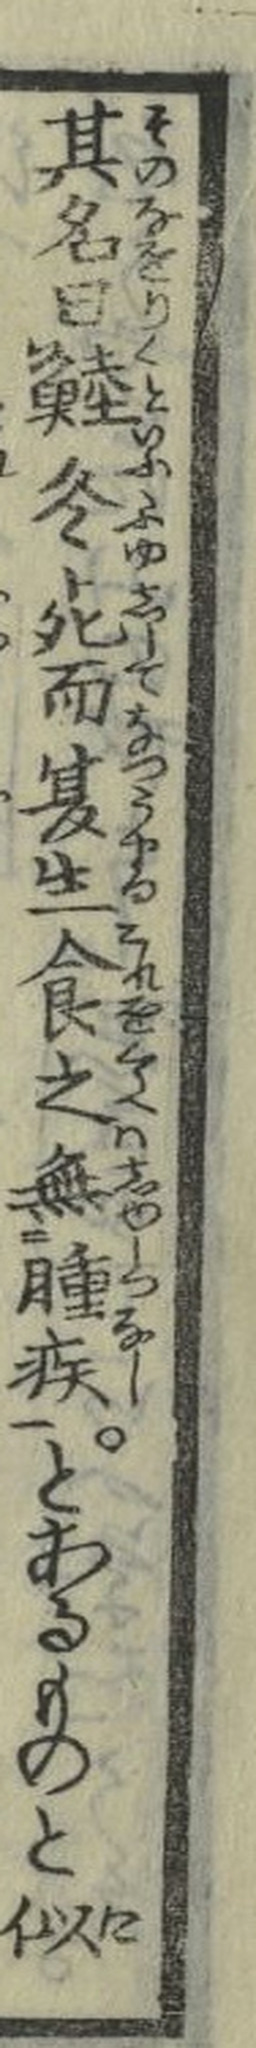其名曰鯥冬死而夏生食之無腫疾。とあるものと似
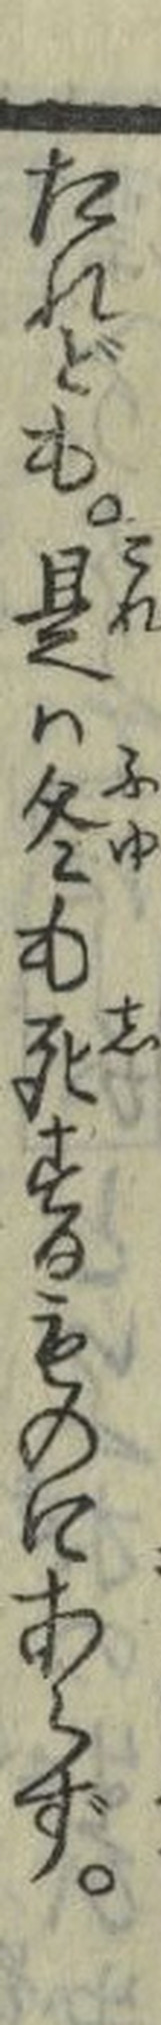たれども。是ハ冬も死するものにあらず。
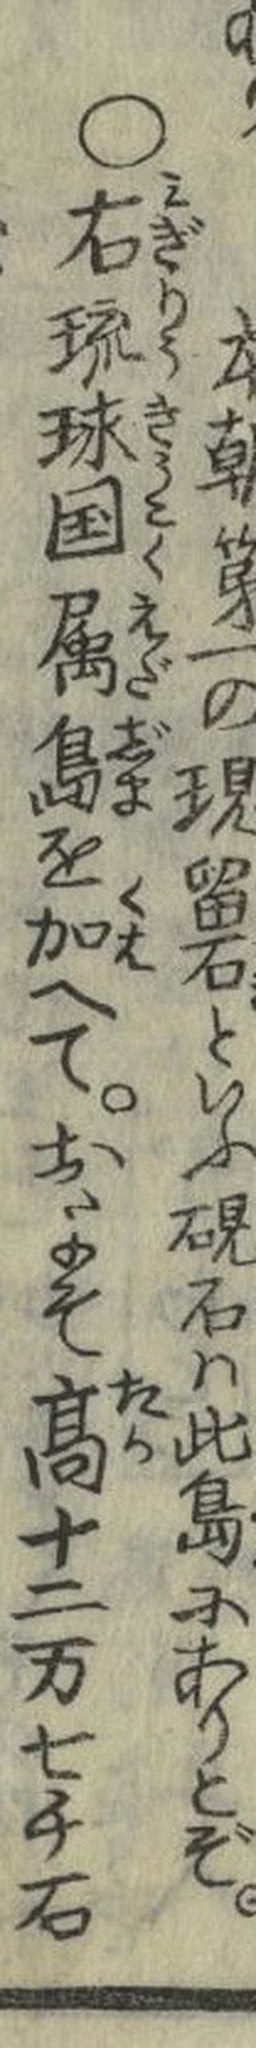〇右琉球国属島を加へて。およそ高十二万七千石
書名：琉球奇譚
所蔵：University of the Ryukyus Library
